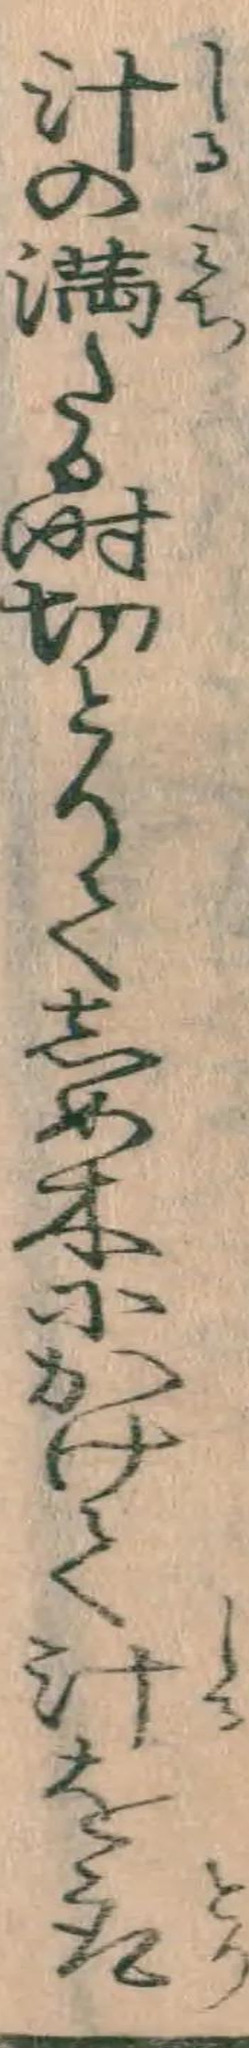汁の満たる時切とりてしめ木にかけて汁を取
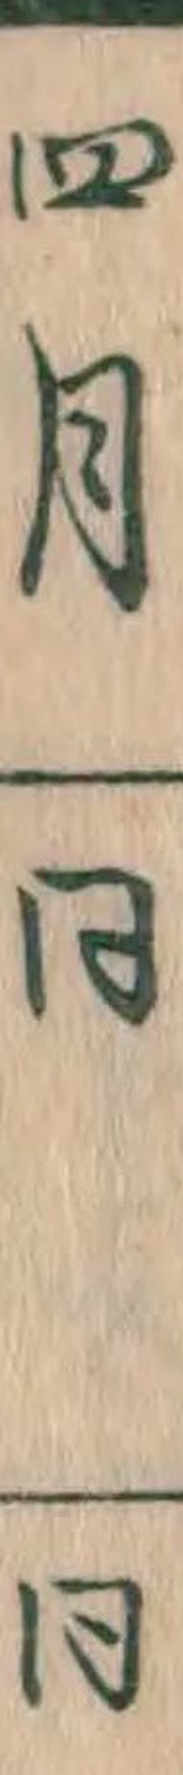四月同同
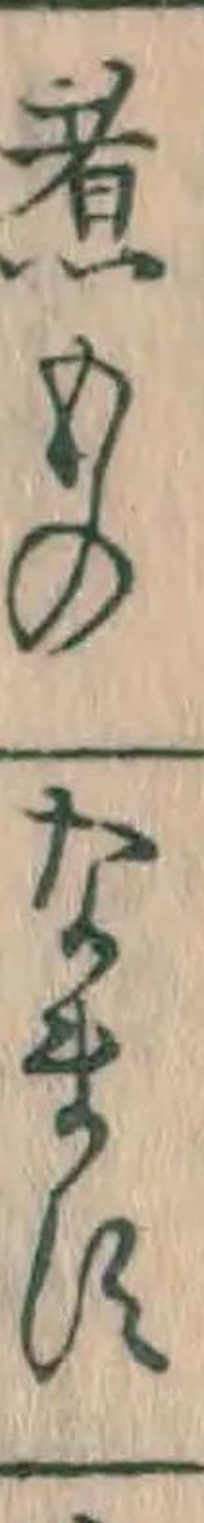煮ものなます汁
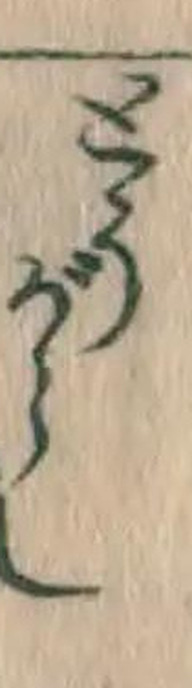とうがらし
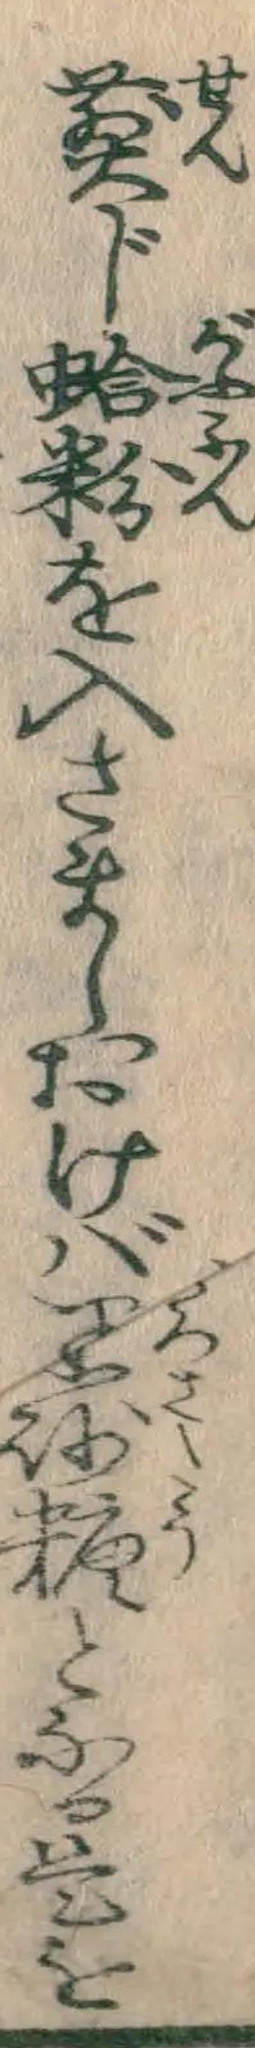煎じ蛤粉を入さましおけば黒砂糖となる是を
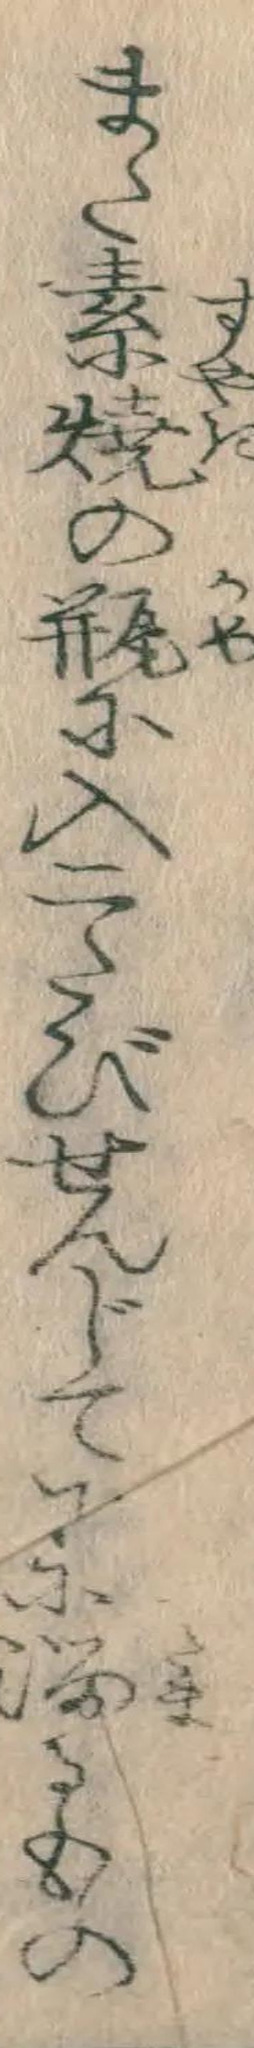また素焼の瓶に入二たびせんじて下に溜るもの
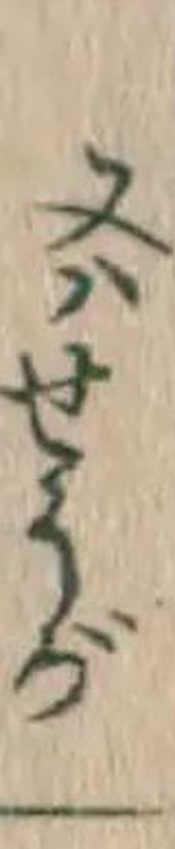又はせうが
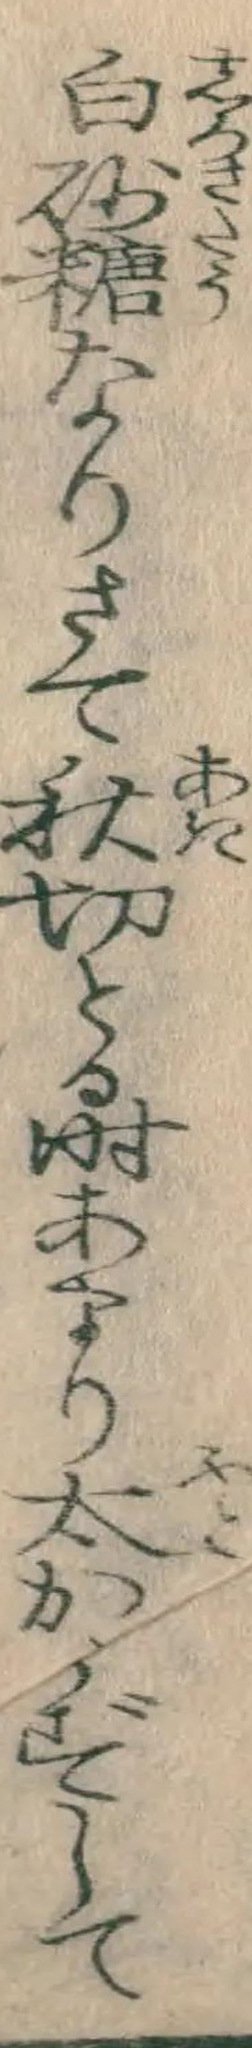白砂糖なりさて秋切とる時あまり太からずして
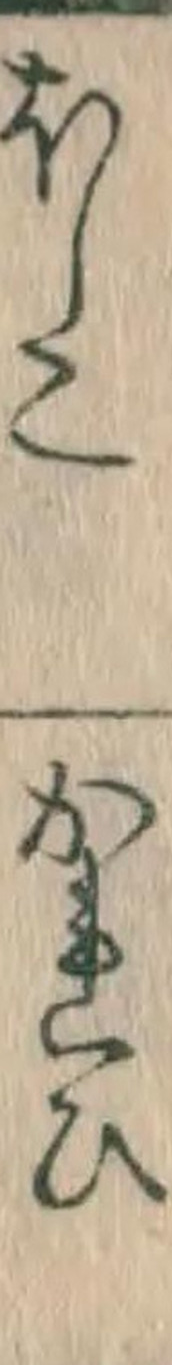ほしこかれひ新
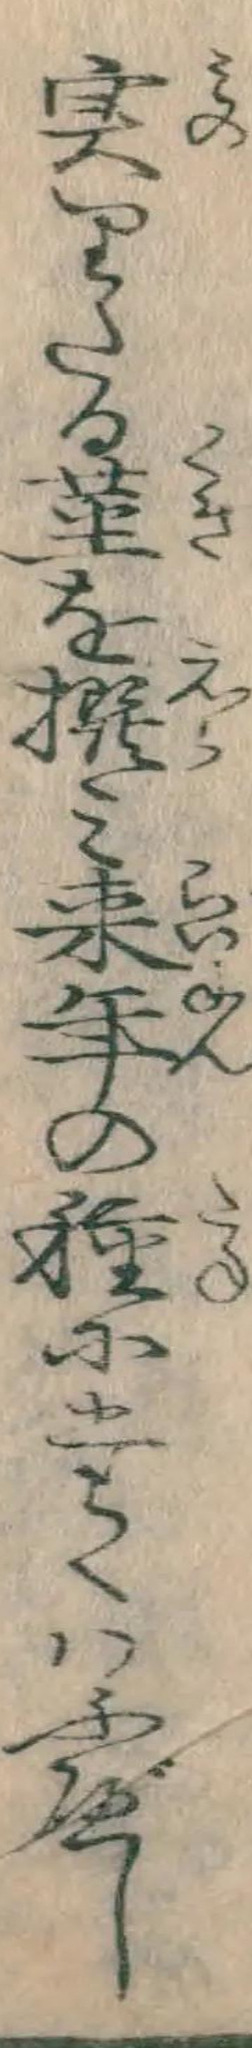実りたる茎を撰み来年の種にたくはふべし
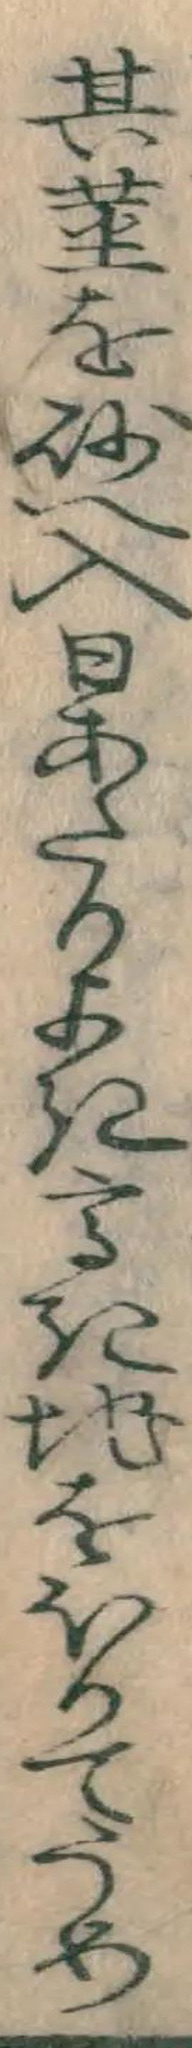其茎を砂に入日あたりよき高き地をほりてうめ
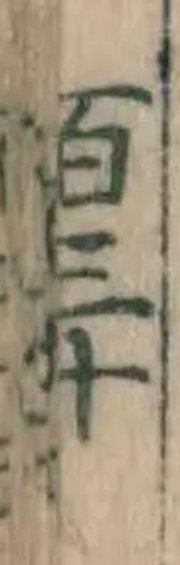百三十

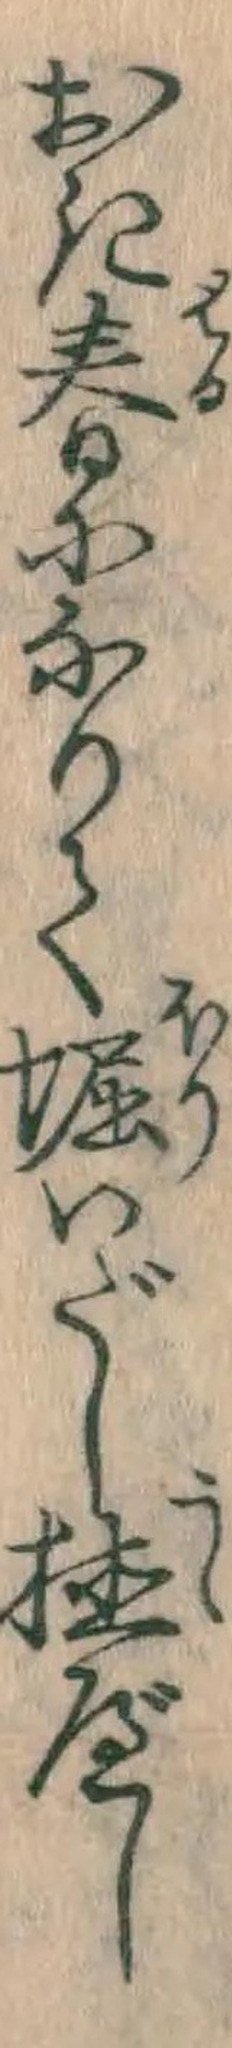おき春になりて掘いだし植べし
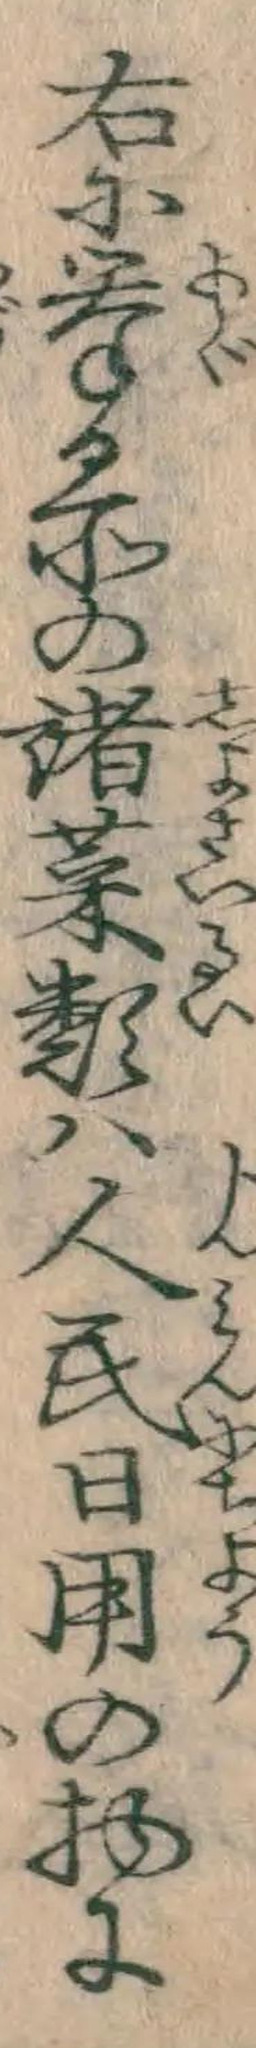右に挙る所の諸菜類は人民日用の物に
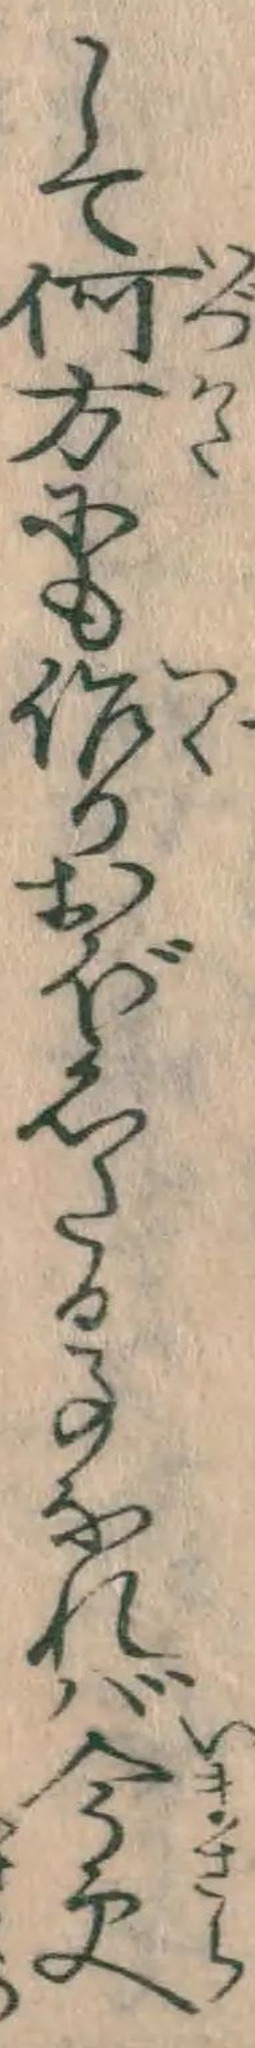して何方にも作りおぼえたる事なれば今更
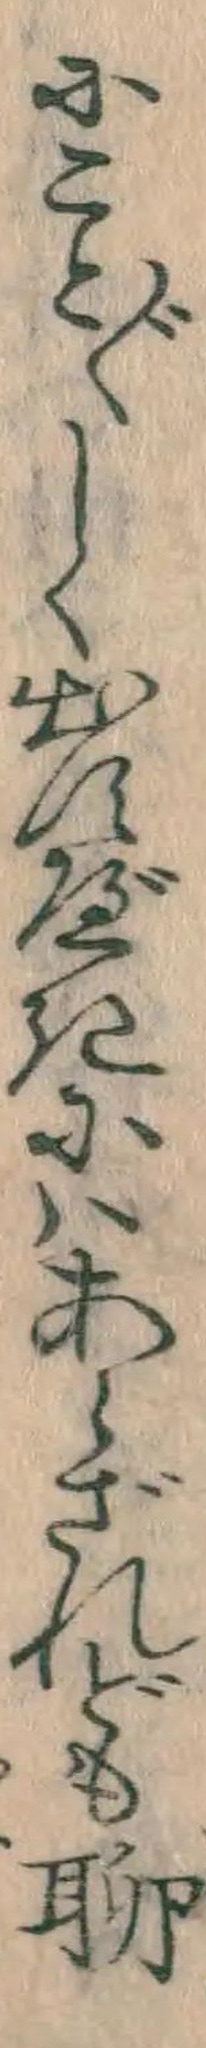にこと〴〵しく出すべきにはあらざれども聊
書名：広益秘事大全 3巻. [5]
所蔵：国立国会図書館 National Diet Library, JAPAN
